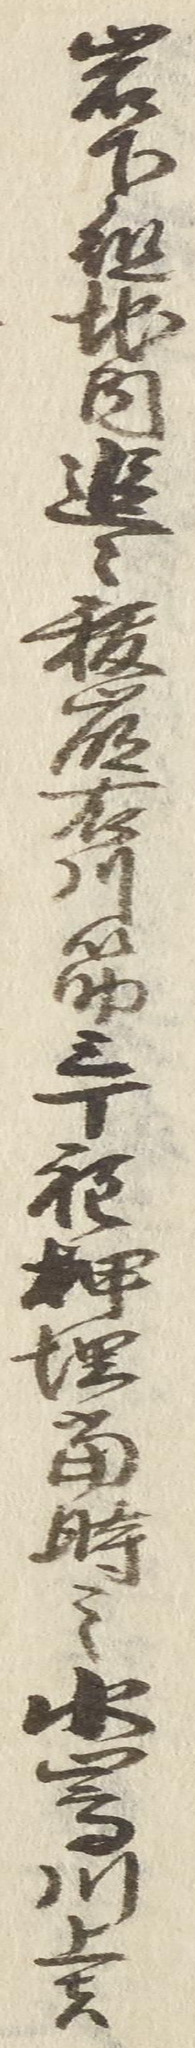岩下組地内追々抜崩右川筋三丁程押埋当時之水嵩川上は
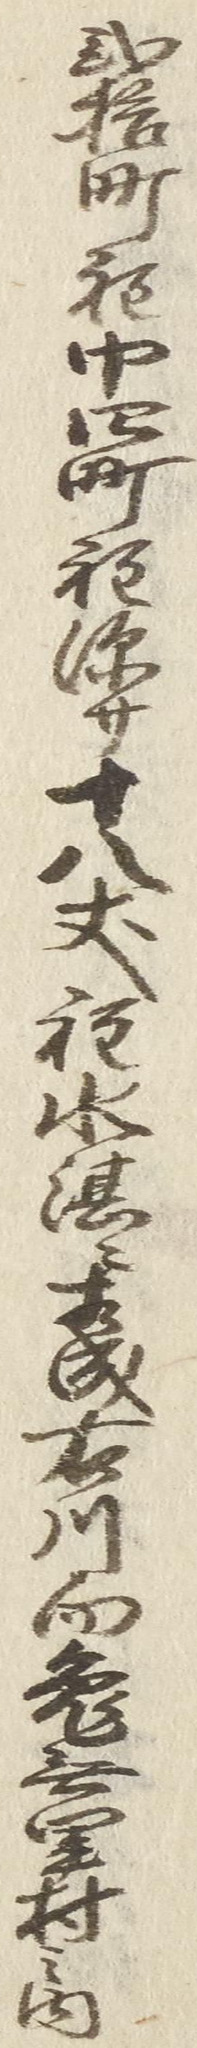弐拾町程幅四町程深サ十八丈程水湛ニ相成右川向鬼無里村之内
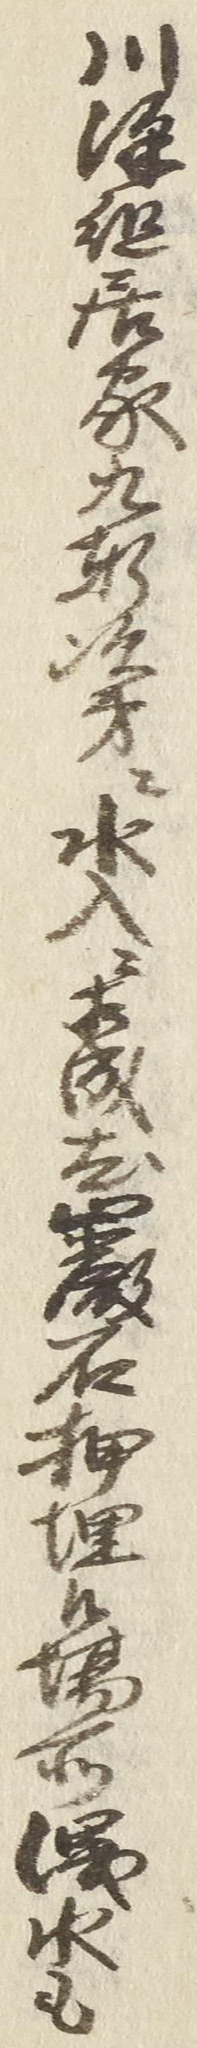川源組居家九軒次第ニ水入ニ相成尤巌石押埋候場所洩水も
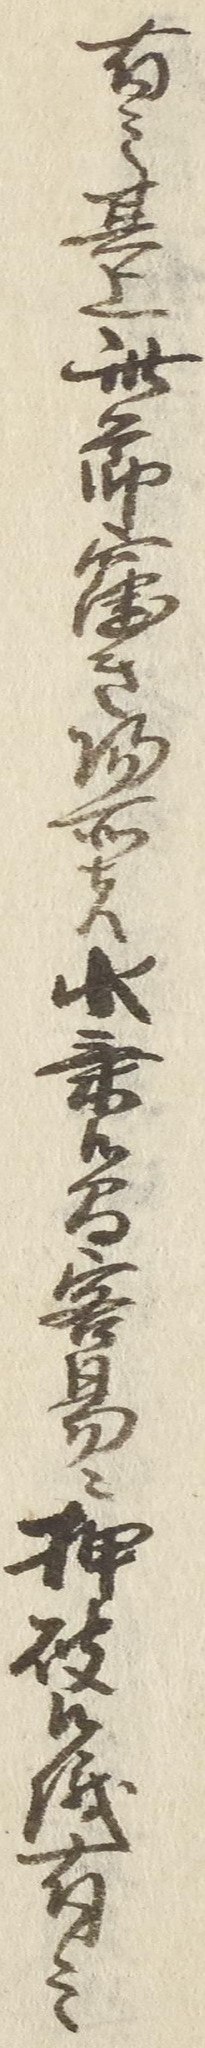有之其上此節窪き帰所は水乗候間容易ニ押破候儀有之
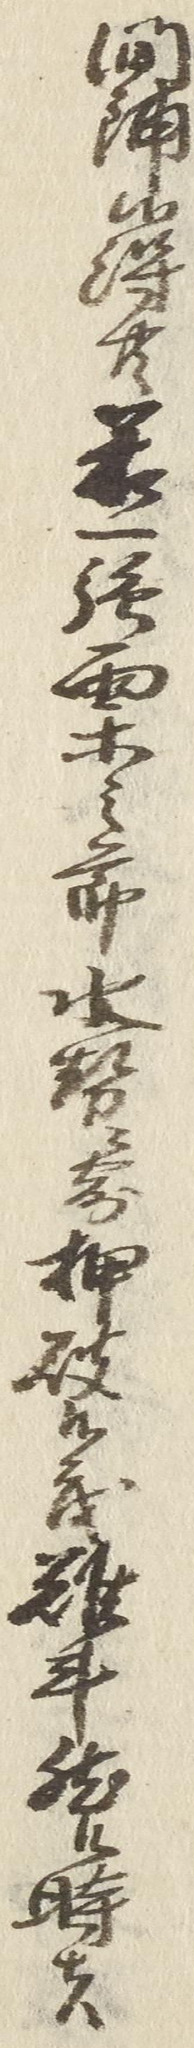間鋪候得共若一強雨等之節水勢ニ寄押破候も難計然ル時は
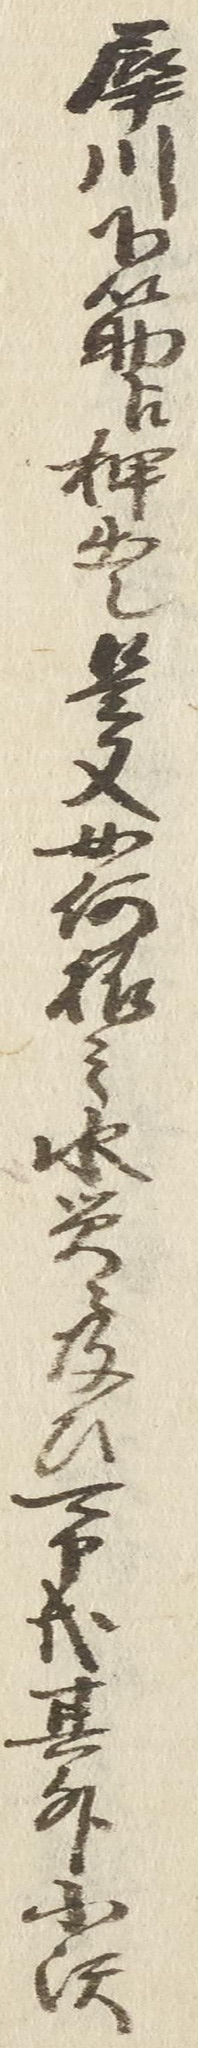犀川下筋江押出し是又如何様之水災ニ及ひ可申哉其外小沢
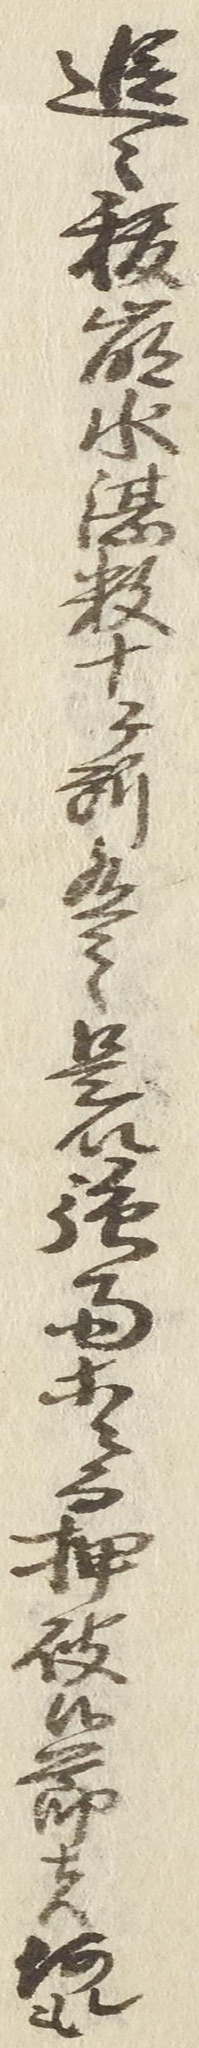追々抜崩水湛数十ヶ所有之是以強雨等ニ而押破候節は何レも
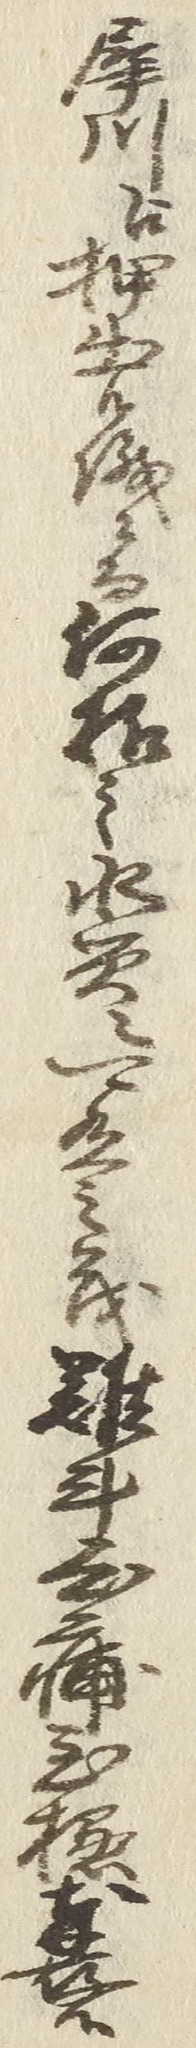犀川江押出ル儀ニ而何様之水災ニ可有之も難計心痛至極奉存候
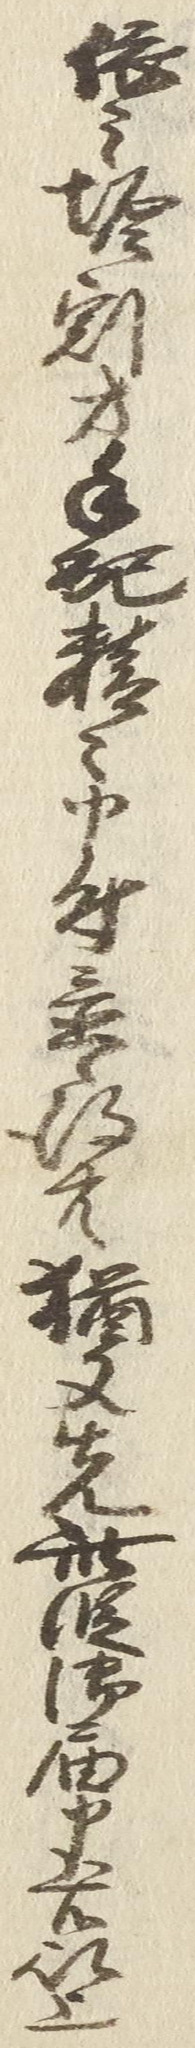依之掘割方手配精々申付置候得共猶又先此度御届申上候以上
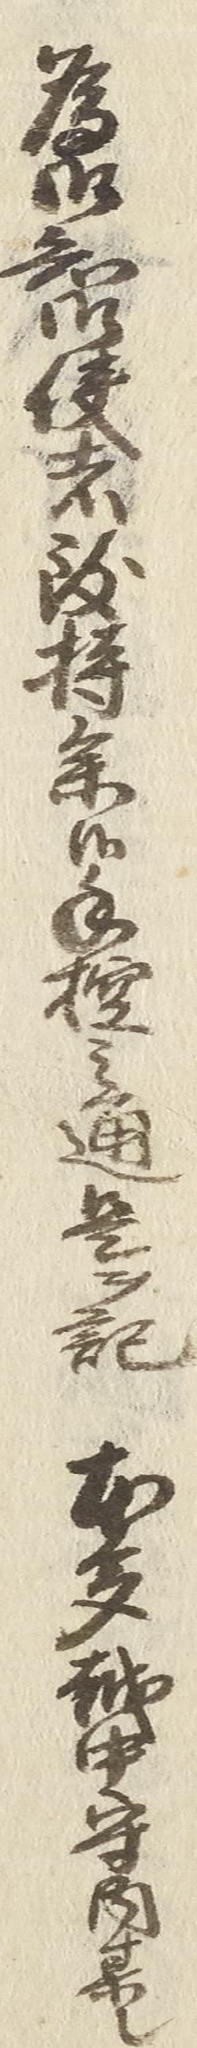為御知御使者致持参候手控之通是ヲ記本多越中守内某し
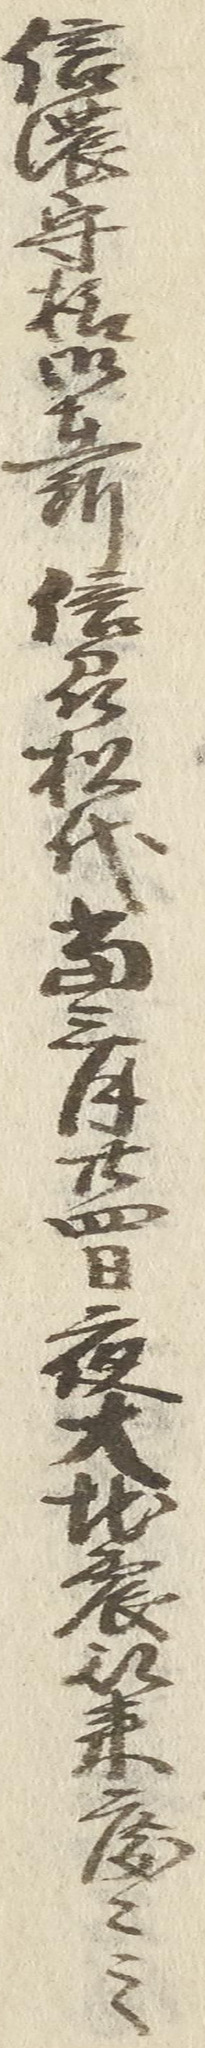信濃守様御在所信州松代当三月廿四日夜大地震以来度々之
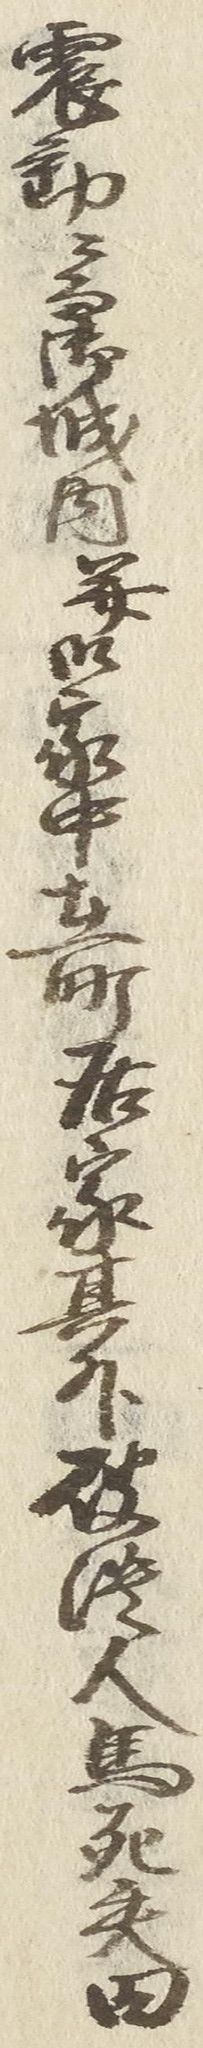震動ニ而御城内并御家中在町居家其外破潰人馬死失田
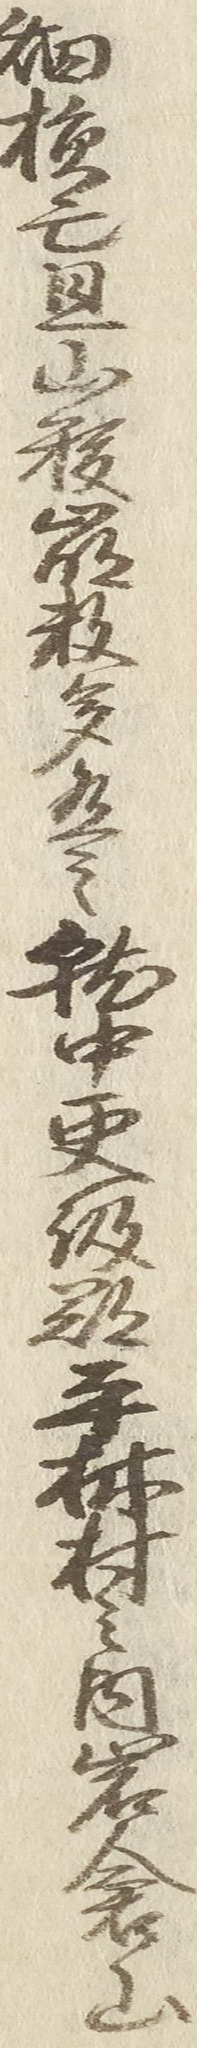畑損亡且山抜崩数多有之就中更級分平林村之内岩倉山
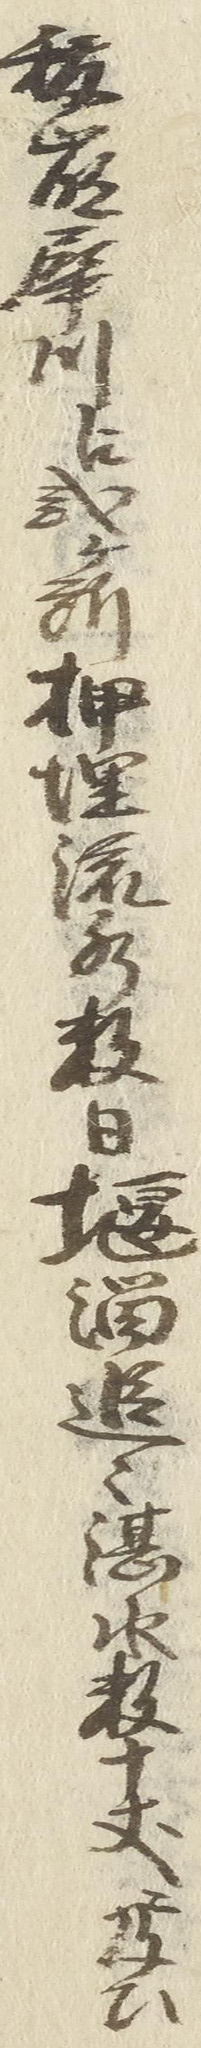抜崩犀川江弐ヶ所押埋流水数日堰溜追々湛水数十丈ニ及ひ
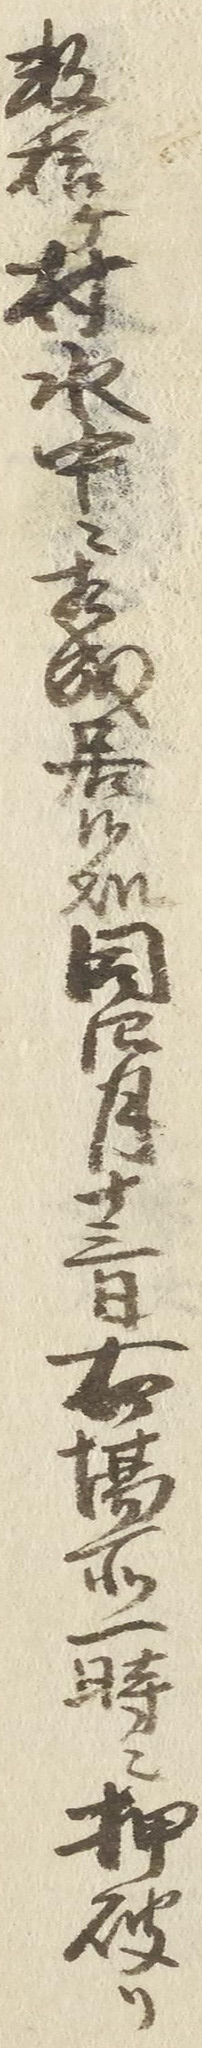数拾ヶ村水中ニ相成居候処同四月十三日右場所一時ニ押破り
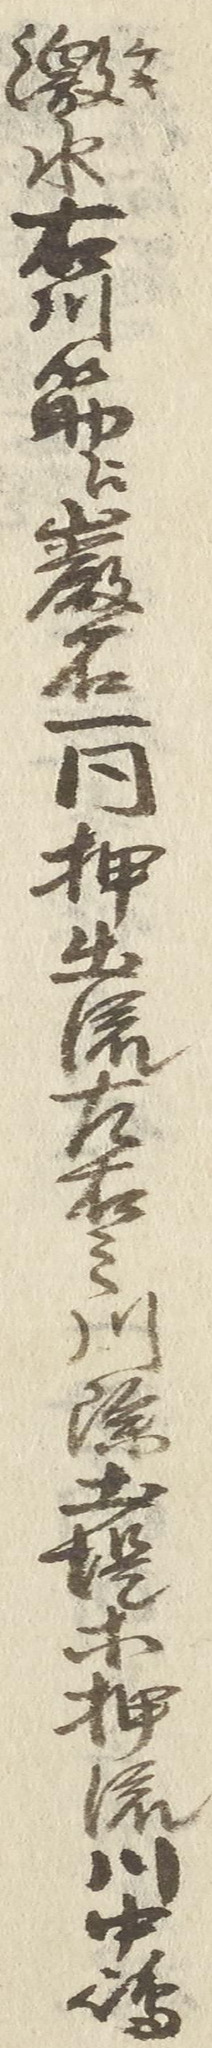激ケキ水右川筋江巌石一同押出流左右之川除土堤等押流川中嶋
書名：従往古地震御届書記誌之一
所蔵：東京大学地震研究所図書室 Earthquake Research Institute Library, The University of Tokyo, JAPAN
